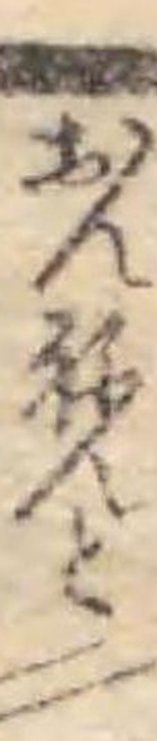おんねんと
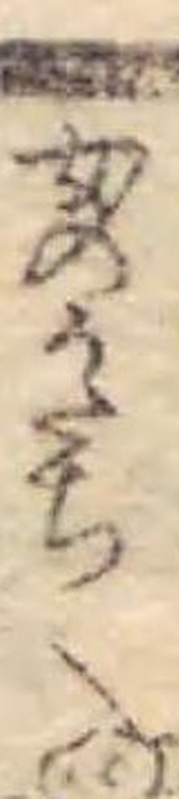女のかたち
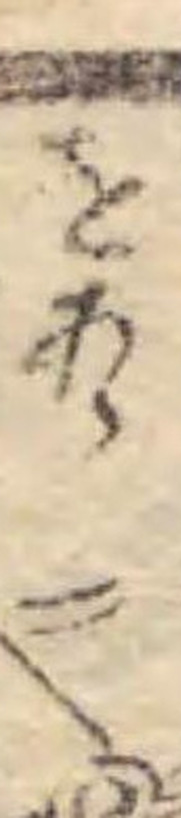をあら
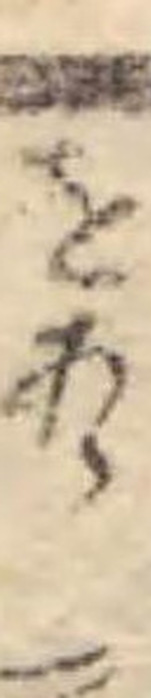をあら
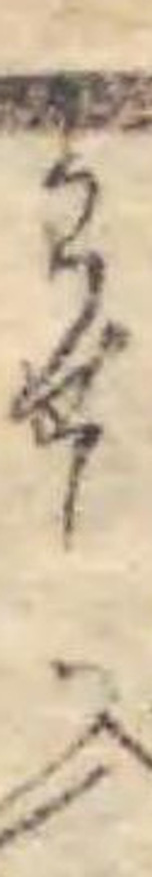わせし
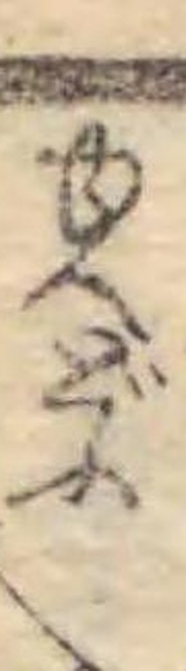ゆへどふ
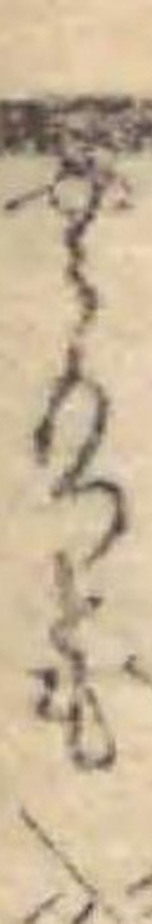やらもつとも
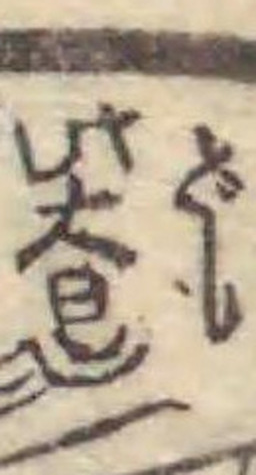此大日
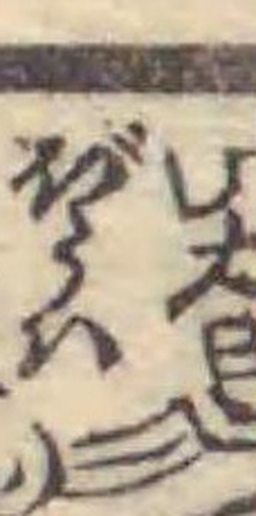ぼうは
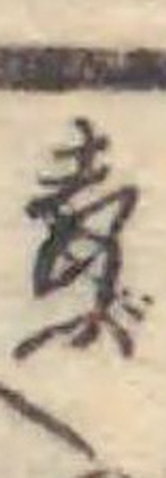しのぶ
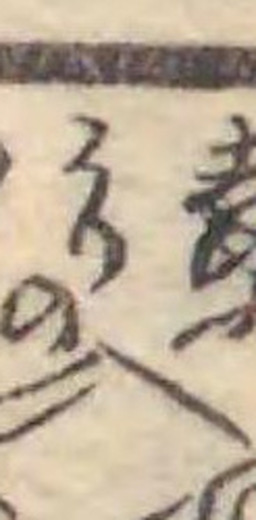うりの
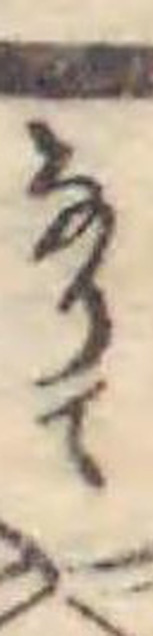なりて
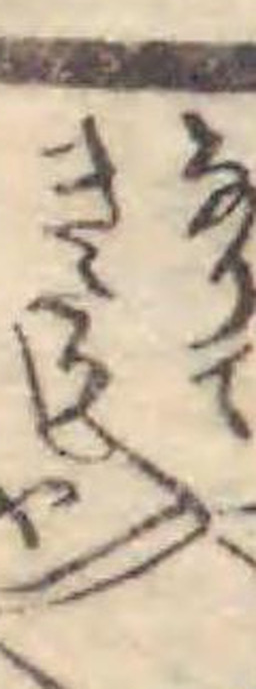きたりしや
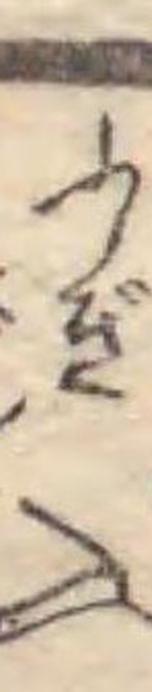ふしぎ
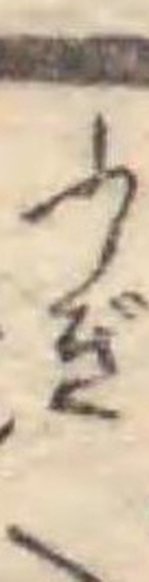ふしぎ
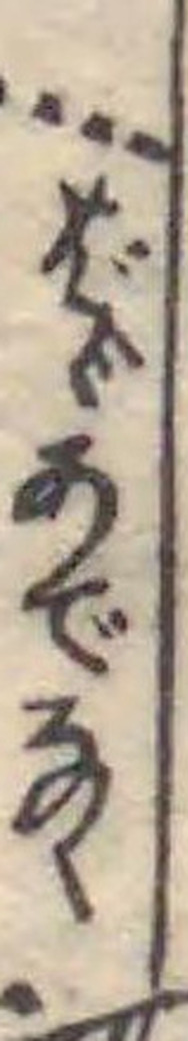ばゝあでなく
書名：鐘入七人化粧 : 3巻
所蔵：国立国会図書館 National Diet Library, JAPAN
